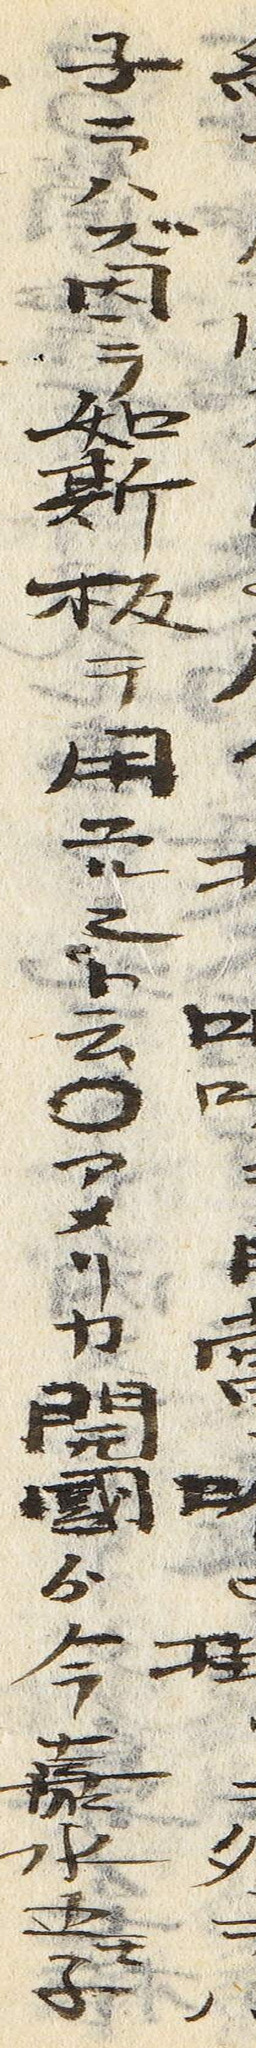ネラハズ因ラ如斯板ヲ用ユル也ト云〇アメリカ開国ゟ今嘉永五壬子
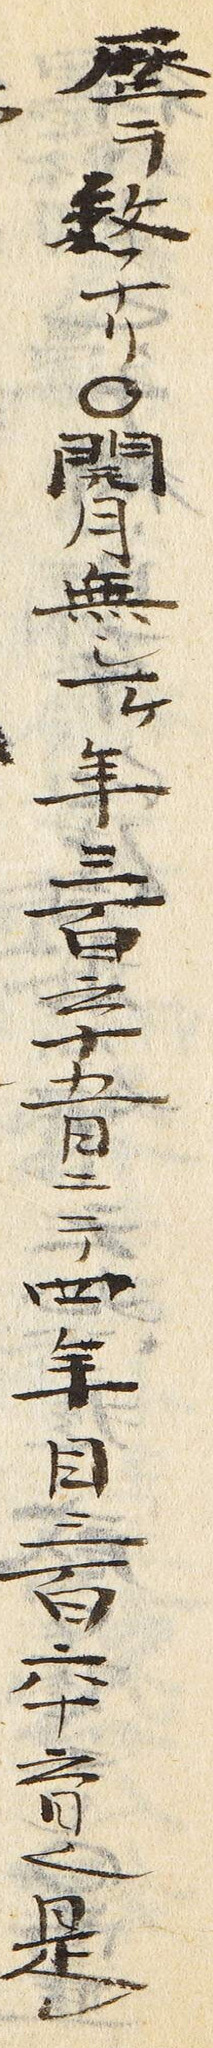歴ヲ数フナリ〇潤月無シ一ヶ年三百六十五日ニテ四年目三百六十六日也是レ
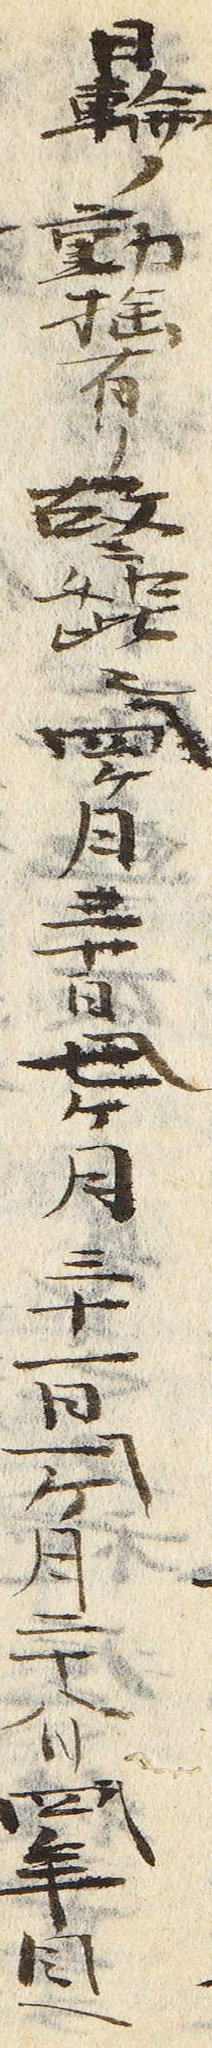日輪ノ動揺有リ故ニ如此也四ヶ月三十日七ヶ月三十一日一ヶ月二十八日四年目一
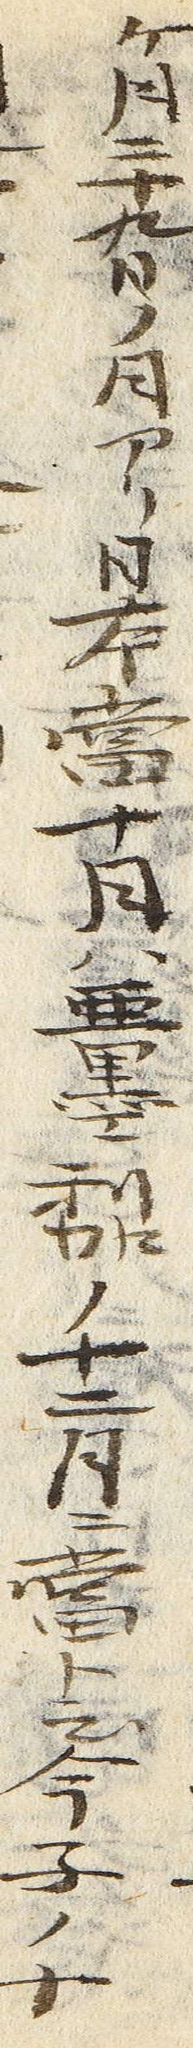ヶ月二十九日ノ月アリ日本当十月ハ亜墨利加ノ十二月ニ当ト云今子ノ十
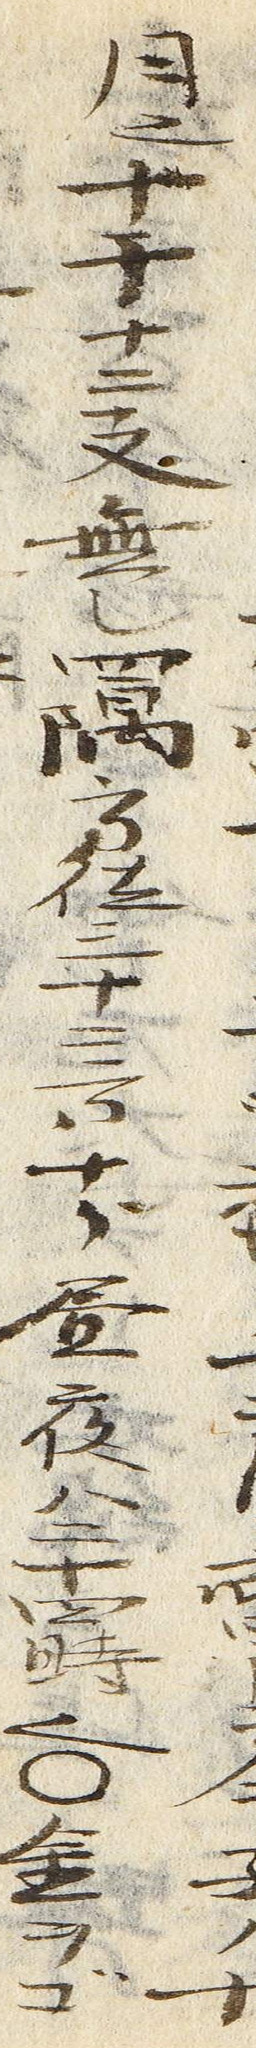月也十干十二支無シ四隅方位三十二方ナリ昼夜ハ二十四時也〇金ヲゴ
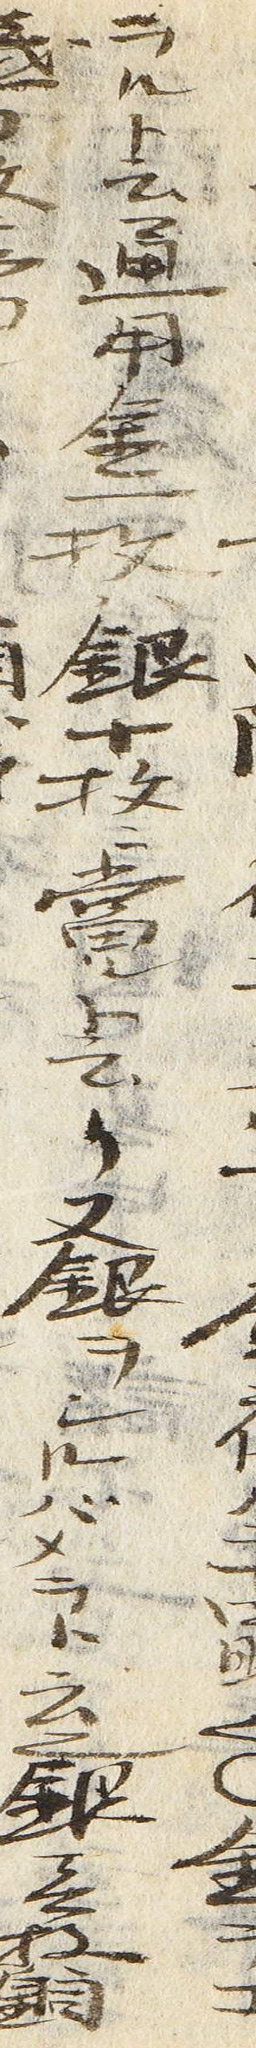ヲルト云通用金一枚ハ銀十枚ニ当ルト云リ又銀ヲシルバメラト云也銀壱枚銅
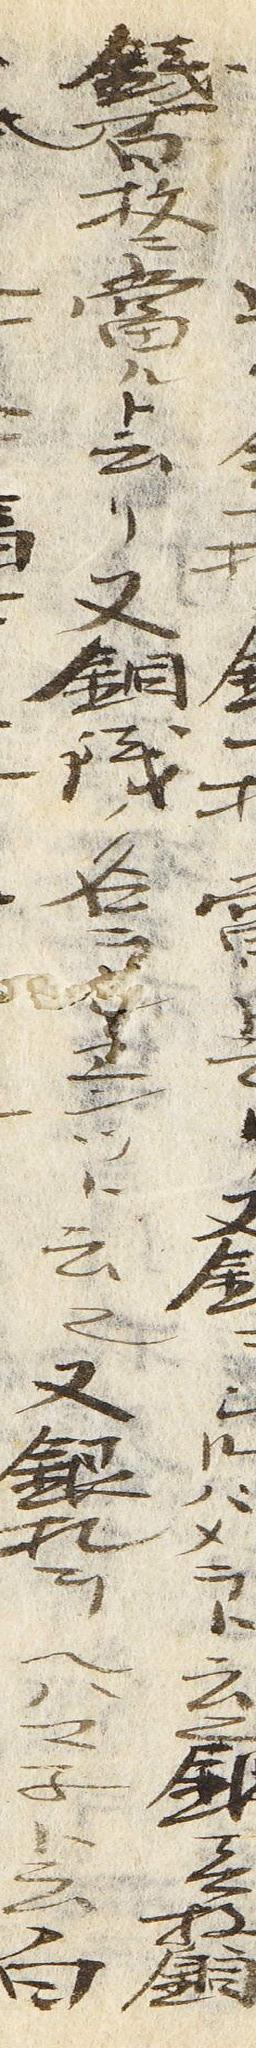銭百枚ニ当ルト云リ又銅銭ノ名エンツト云也又銀札ヲヘハマ子ト云白
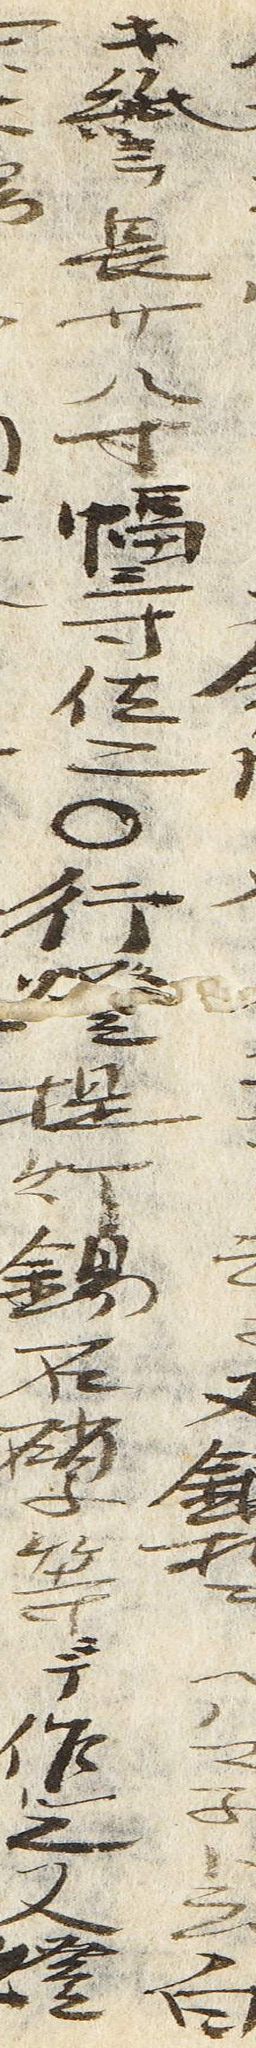キ紙ニテ長サ八寸幅三寸位也〇行燈提灯錫石硝子等ニテ作ル也又燈
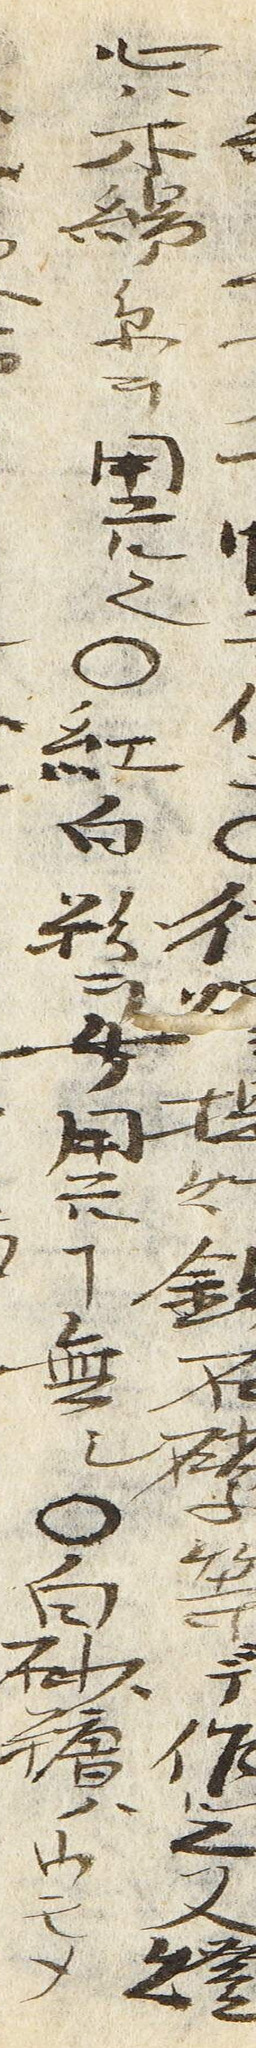心ハ木綿糸ヲ用ユル也〇紅白粉ヲ少用ユル事無シ〇白砂糖ハモメ
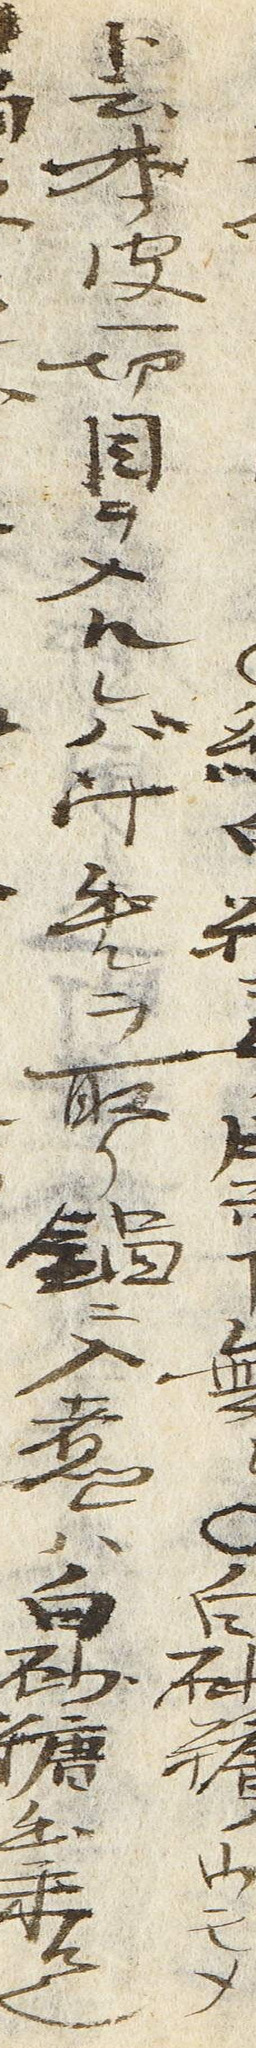ト云本皮ヘ切目ヲ入ルレバ汁出ルヲ取リ鍋ニ入煑レハ白砂糖出来ル也
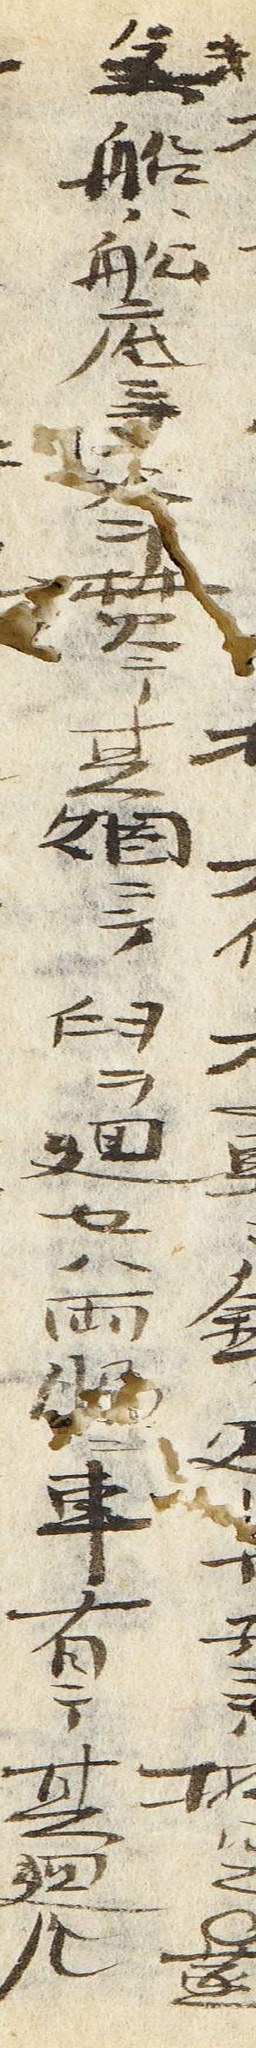気船ハ船底ニヲ焚テ其煙ニテ臼ヲ廻セハ両側ニ車有テ其廻ル
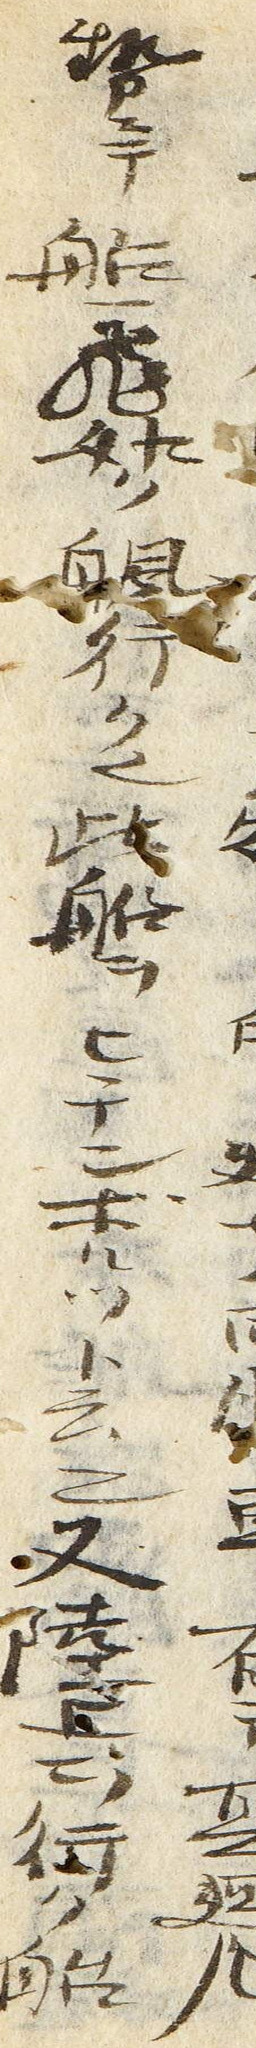勢ニテ船一飛如ク帆行ク也此船ヲヒチンボルツト云也又陸上ヲ行ク船

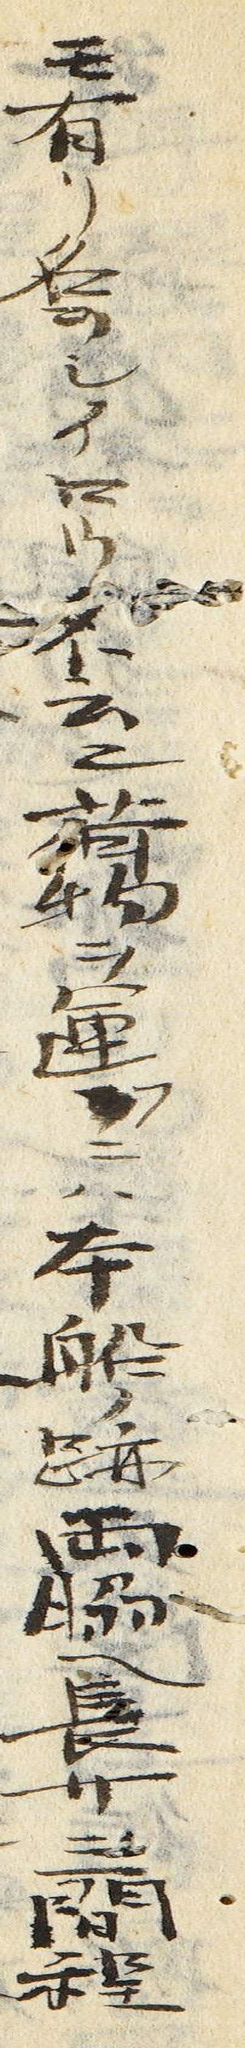モ有リ名ヲシイロウハメト云也荷物ヲ運フニハ本船ノ跡両脇ヘ長サ三間程
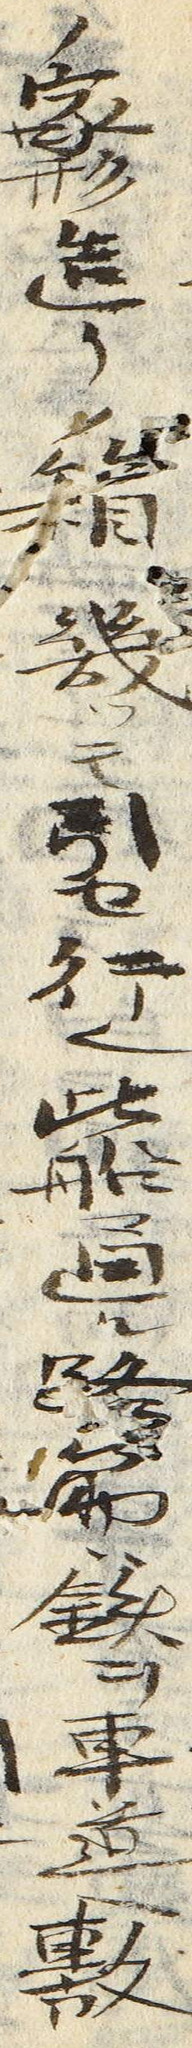ノ家形造リノ箱ヲ幾ツモ引セ行也此船通ル路筋鉄ヲ車道ヘ敷
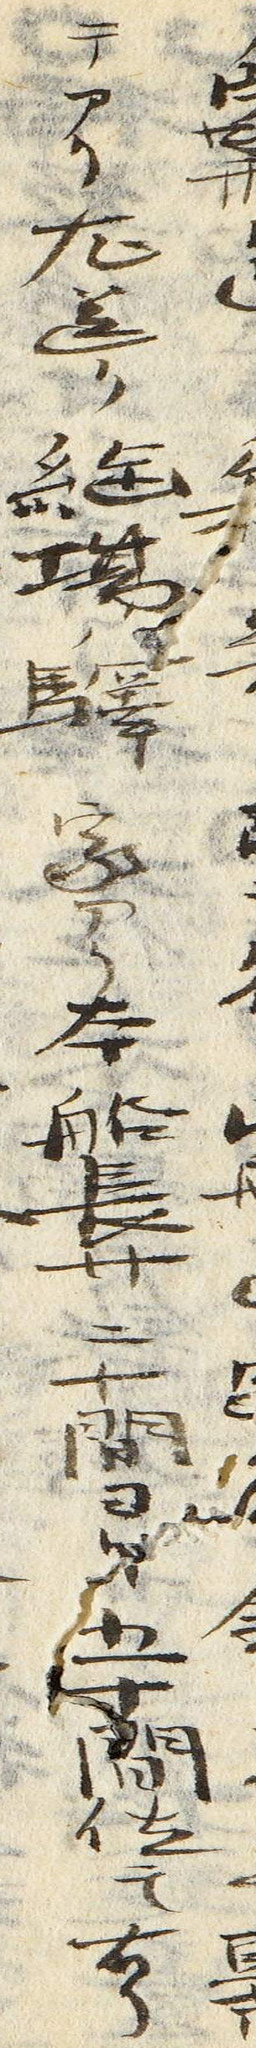テアリ尤送リ継場ノ駅家アリ本船長サ二十間ヨリ五十間位モ有リ
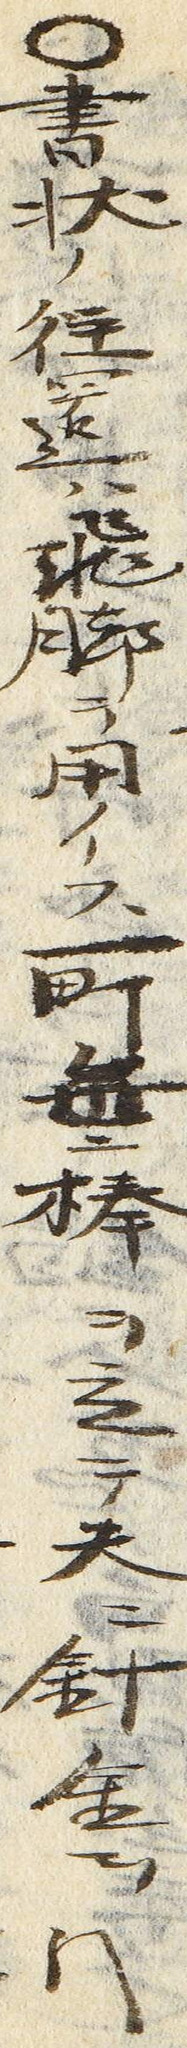〇書状ノ往還ハ飛脚ヲ用イス一町毎ニ棒ヲ立テ夫ニ針金ヲ引
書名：漂流記聞
